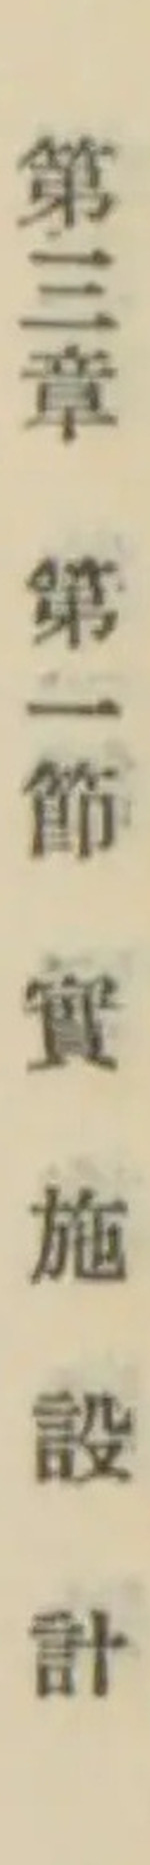第三章第一節実施設計
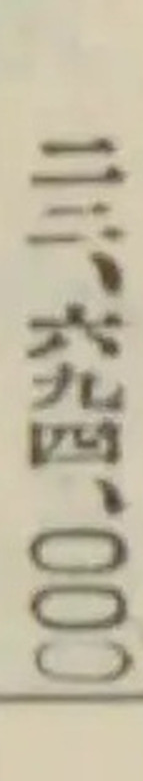計二二、六九四、〇〇〇
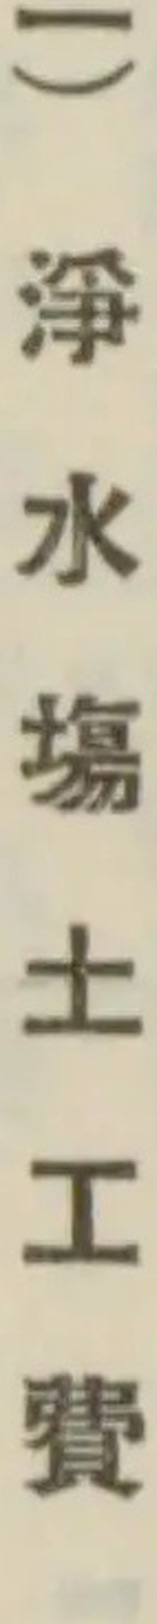(三)浄水場土工費
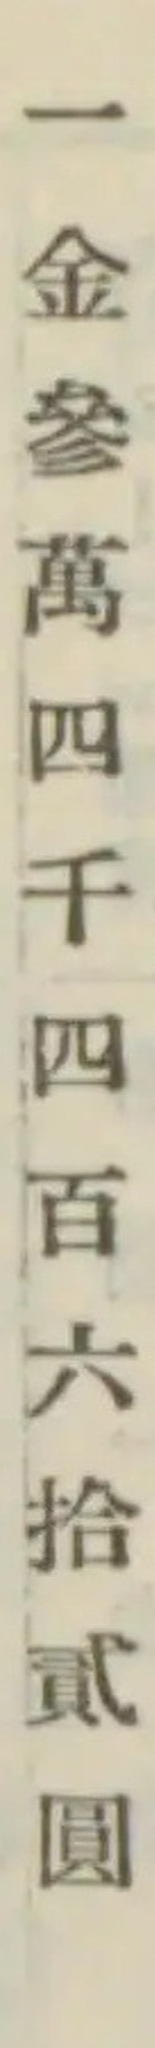一金參萬四千四百六拾貳圓
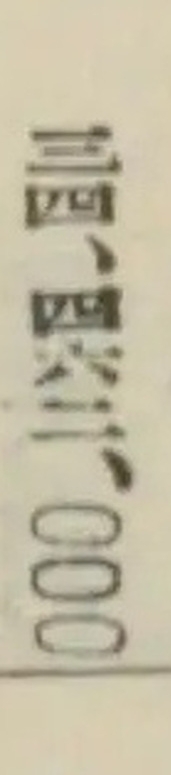計三四、四六二、〇〇〇
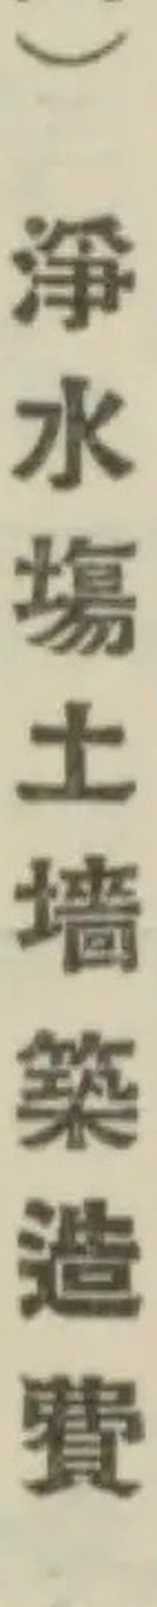(四)浄水場土墻築造費
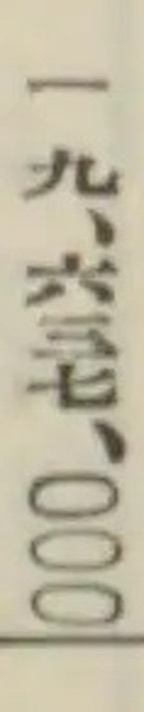計一九、六三七、〇〇〇
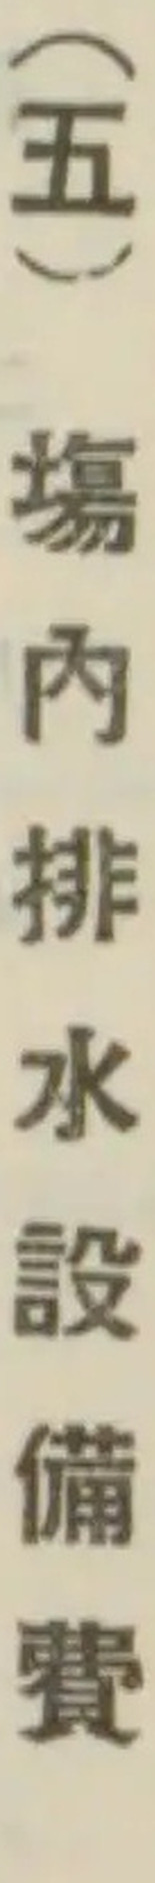(五)場内排水設備費
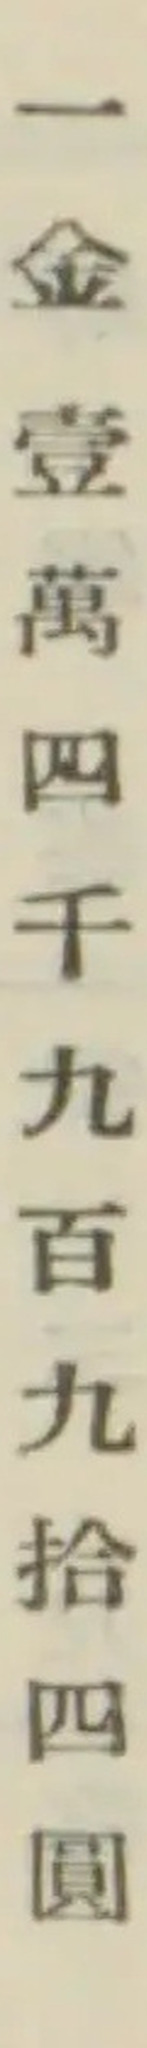一金壹萬四千九百九拾四圓
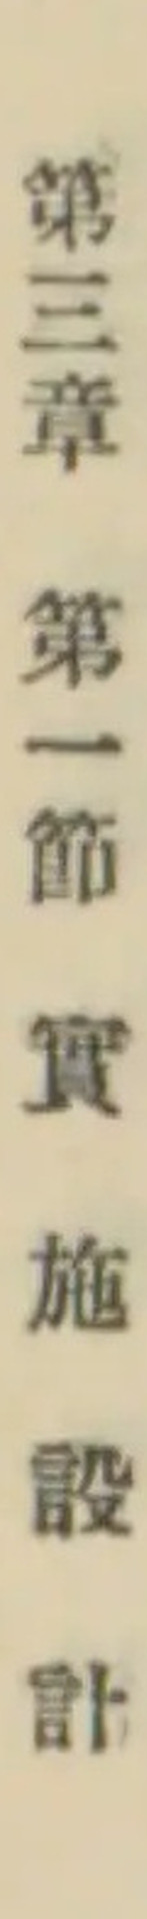第三章第一節実施設計

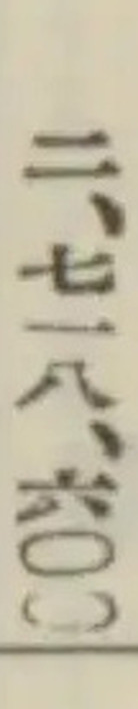計二、五九八、〇〇〇
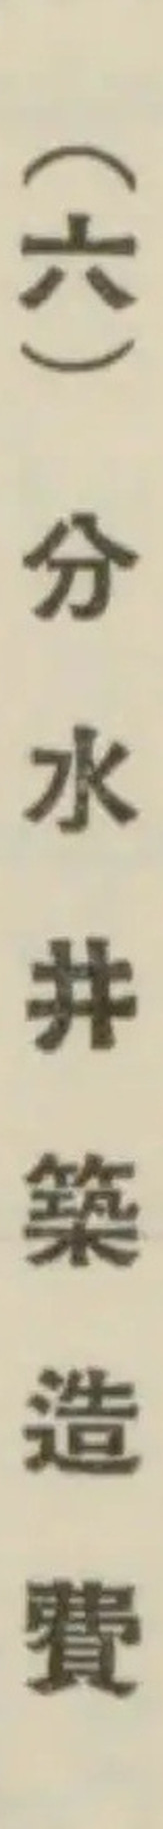(六)分水井築造費
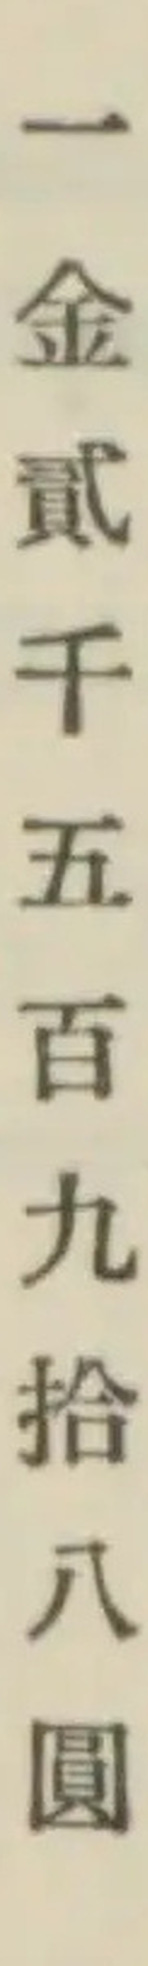一金貳千五百九拾八圓
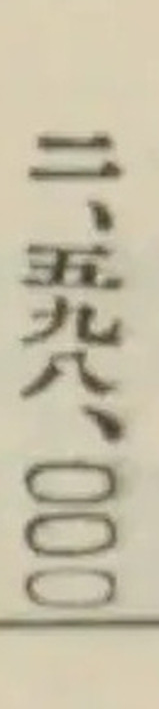計二、五九八、〇〇〇
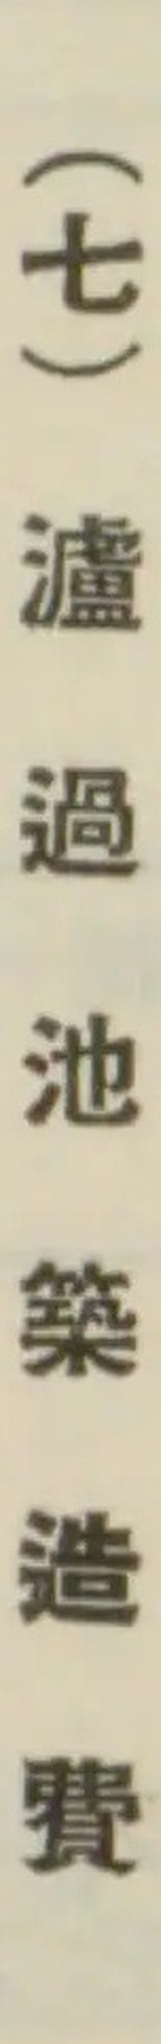(七)濾過池築造費
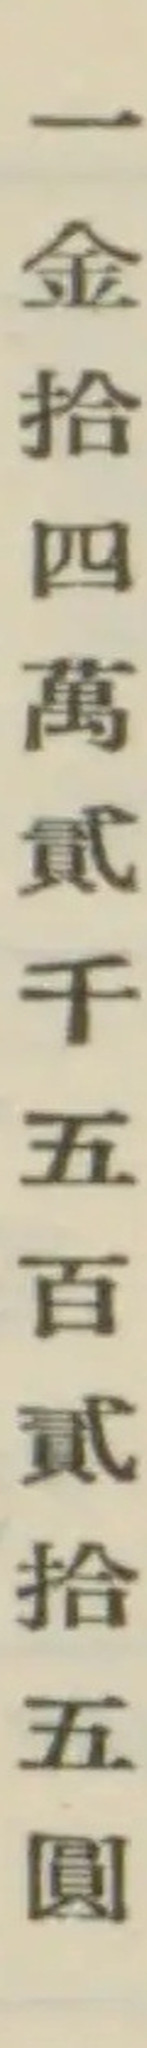一金拾四萬貳千五百貳拾五圓
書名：豊橋市水道誌
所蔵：国立国会図書館 National Diet Library, JAPAN
